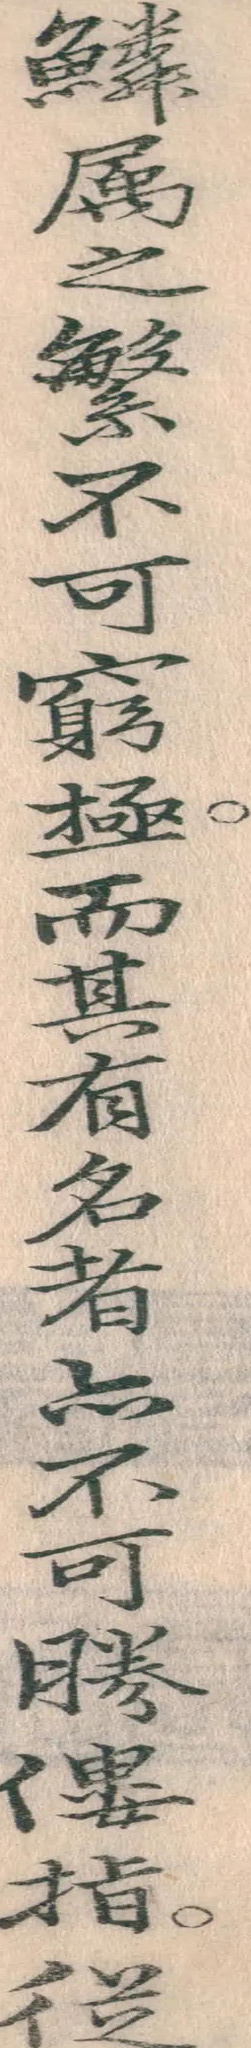鱗属之繁不可窮極。而其有名者亦不可勝僂指。従
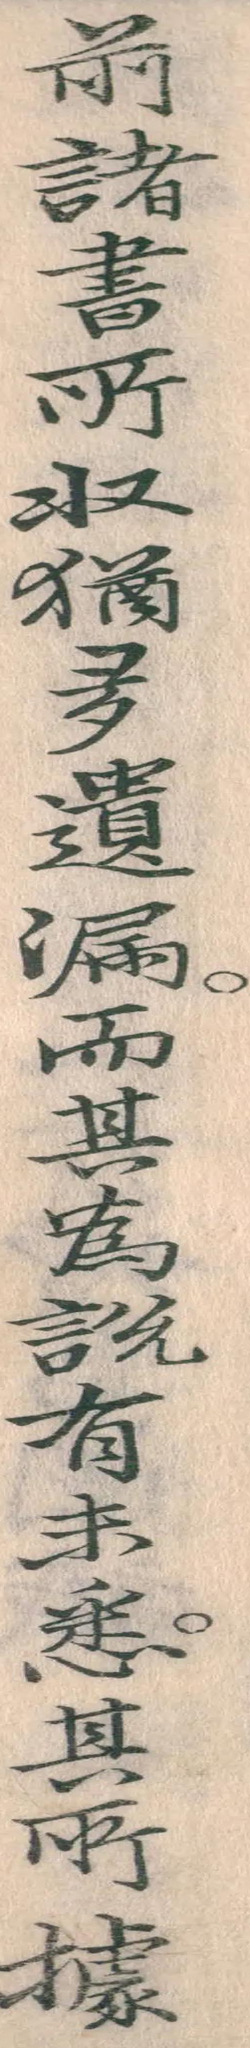前諸書所収猶多遺漏。而其為説有未悉。其所拠
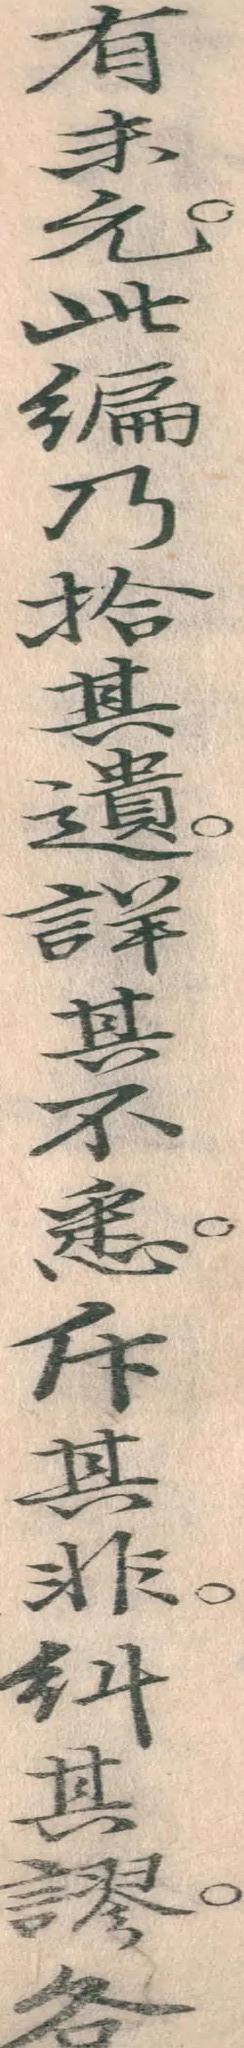有未允。此編乃拾其遺。詳其不悉。斥其非。糾其謬。各
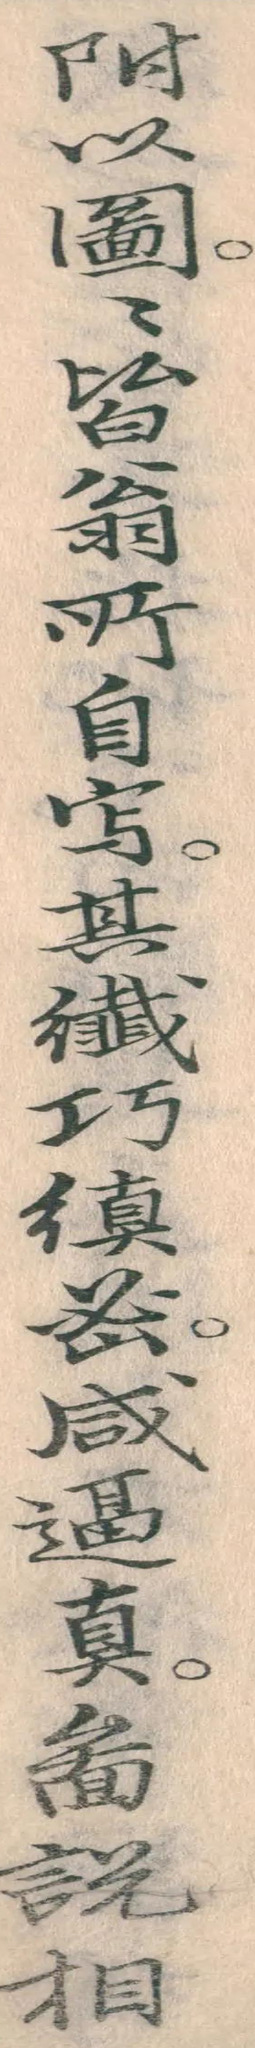附以図。ゝ皆翁所自写。其繊巧縝密。咸逼真。図説相
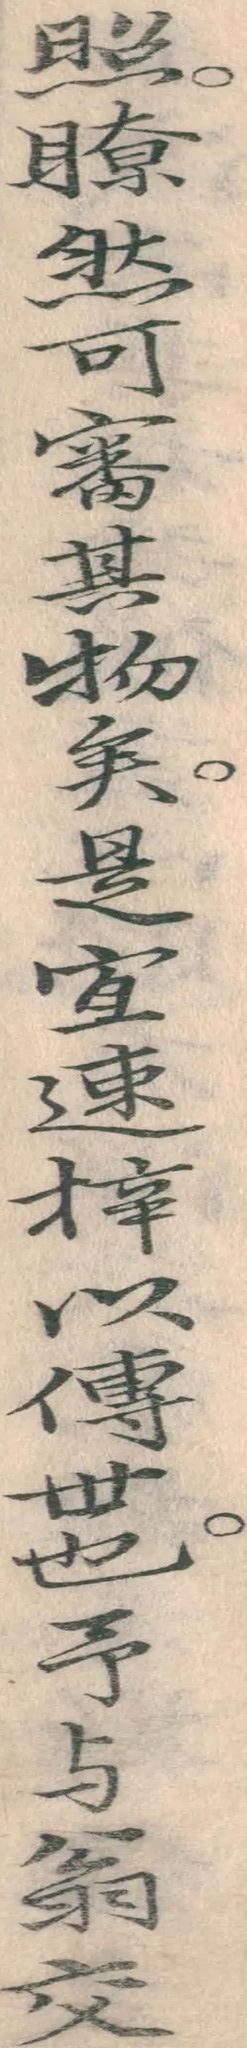照。瞭然可審其物矣。是宜速梓以伝世也。予与翁交

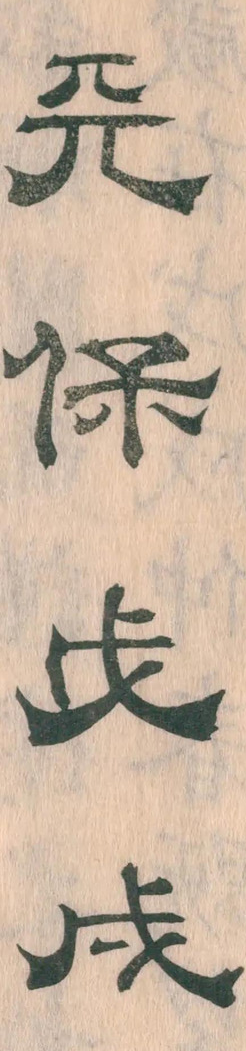天保戊戌
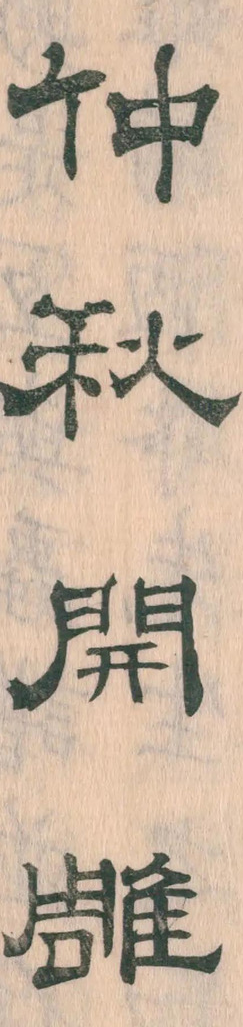仲秋開雕
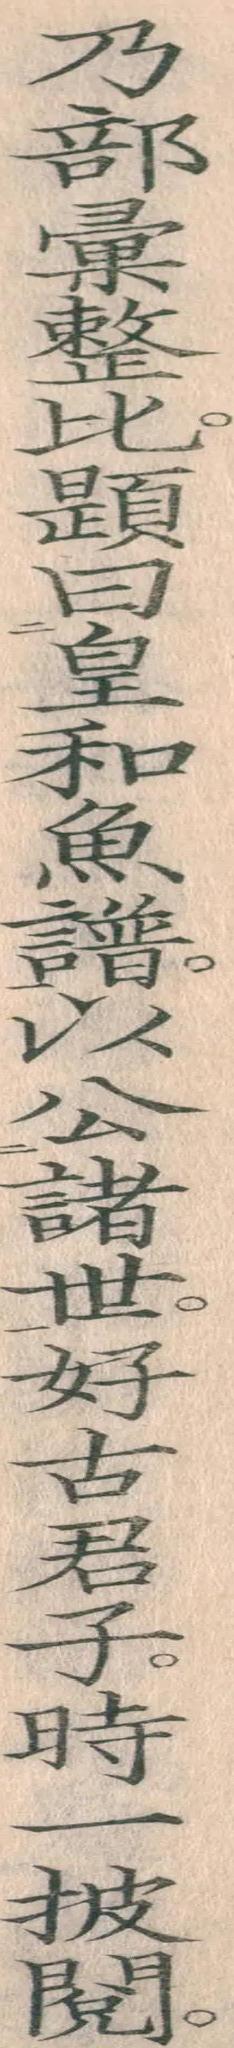乃部彙整比。題曰皇和魚譜。以公諸世。好古君子。時一披閲。
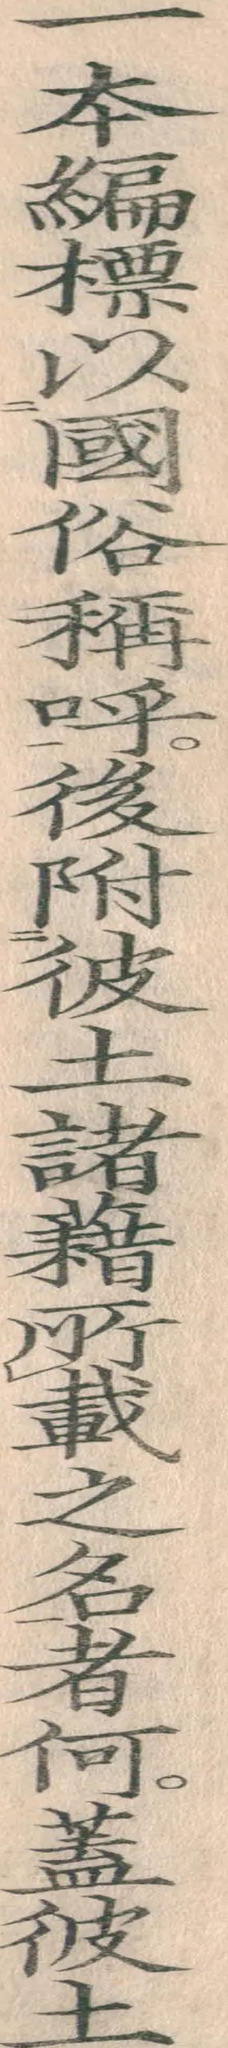一本編標以国俗称呼。後附彼土諸籍所載之名者何。蓋彼土
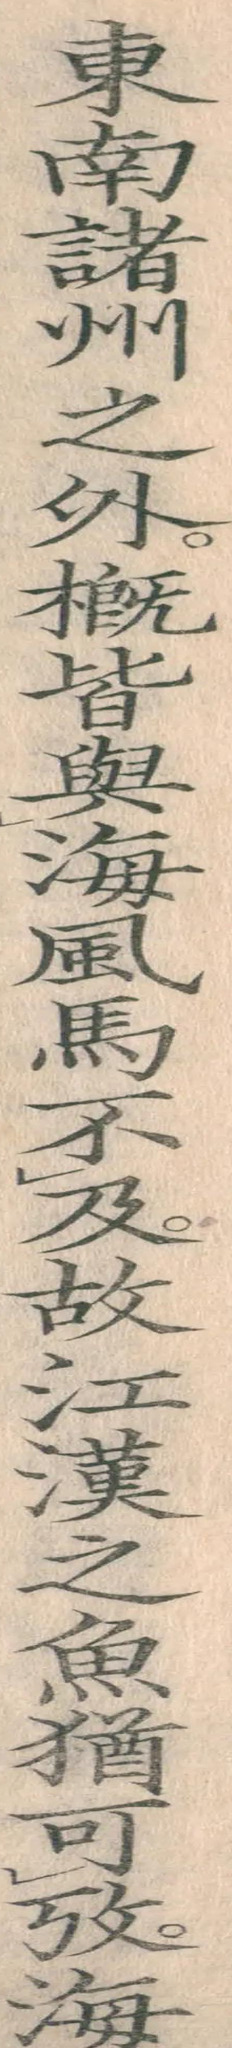東南諸州之外。概皆与海風馬不及。故江漢之魚猶可攷。海

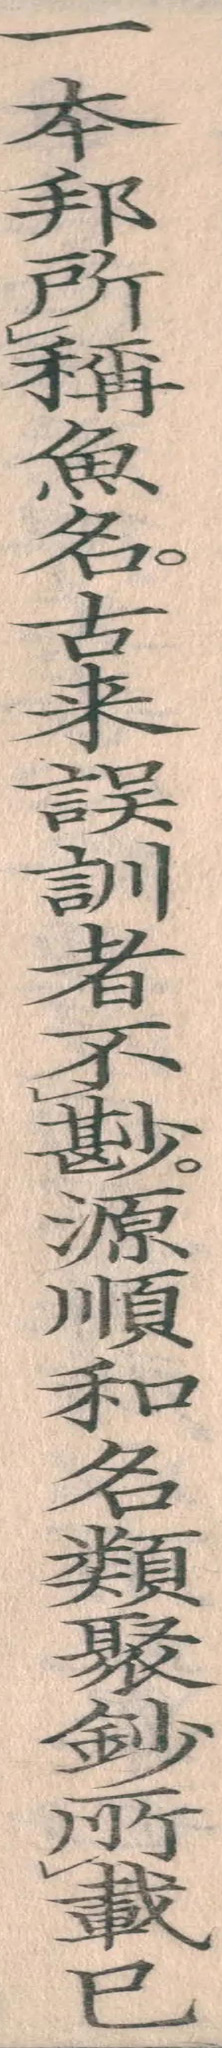一本邦所称魚名。古来誤訓者不尠。源順和名類聚鈔所載巳
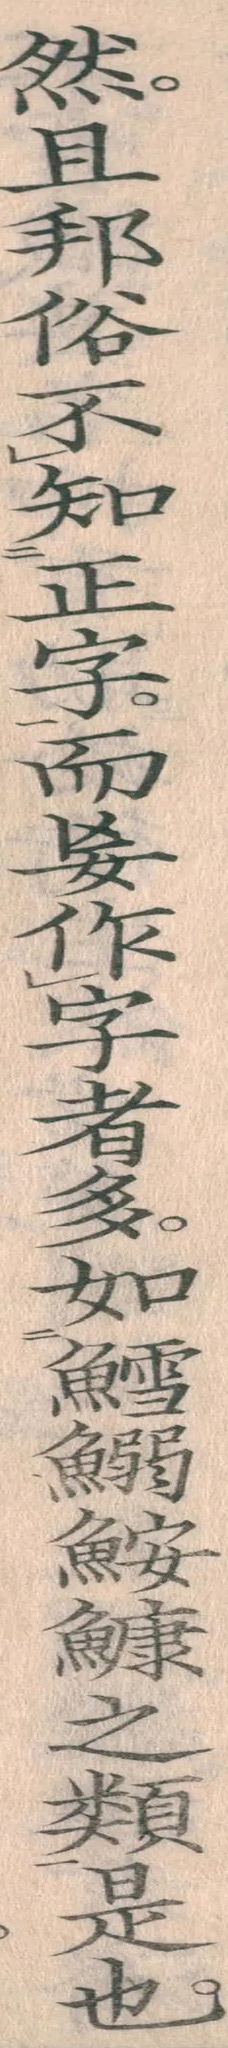然。且邦俗不知正字。而妄作字者多。如鱈鰯鮟鱇之類是也。
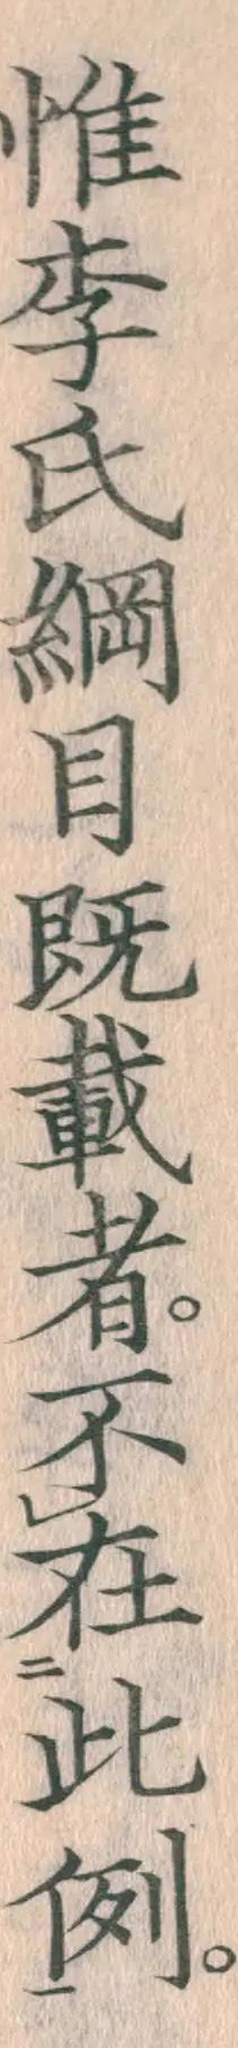惟李氏綱目既載者。不在比例。
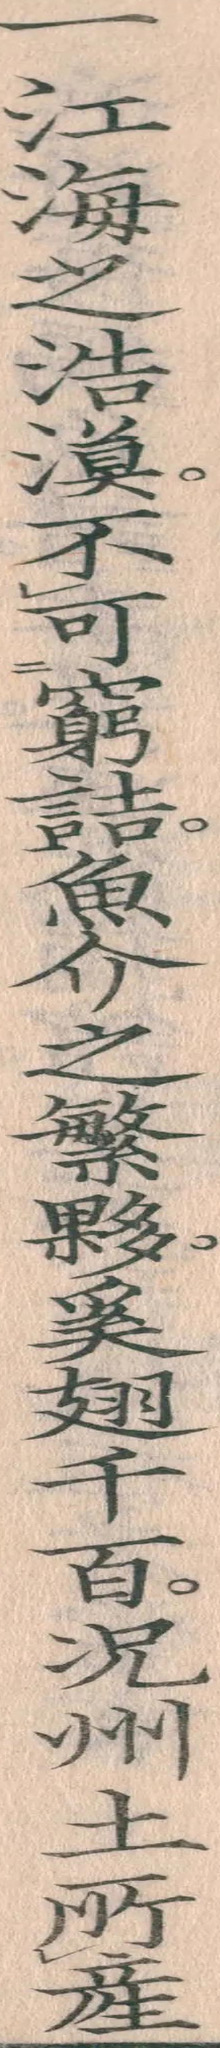一江海之浩漠。不可窮詰。魚介之繁夥。奚翅千百。況州土所産
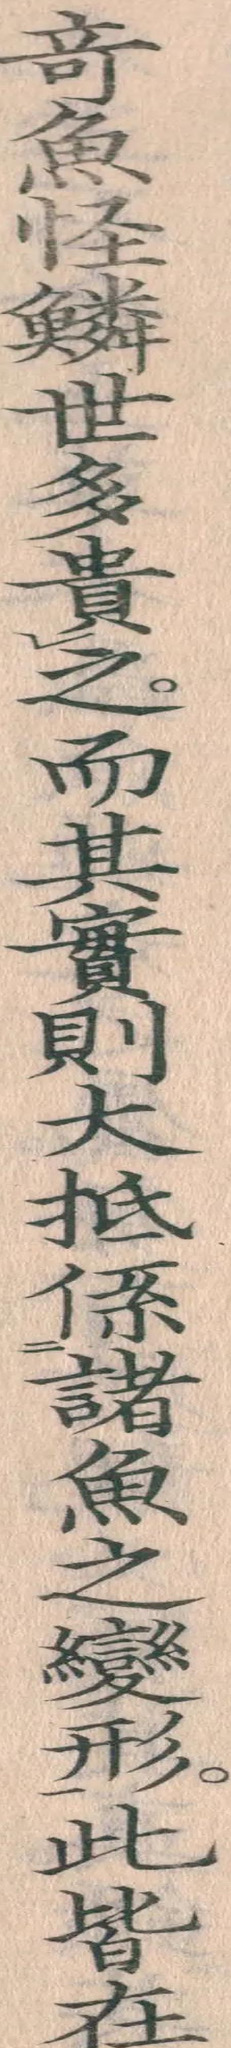奇魚怪鱗世多貴之。而其実則大抵係諸魚之変形。此皆在
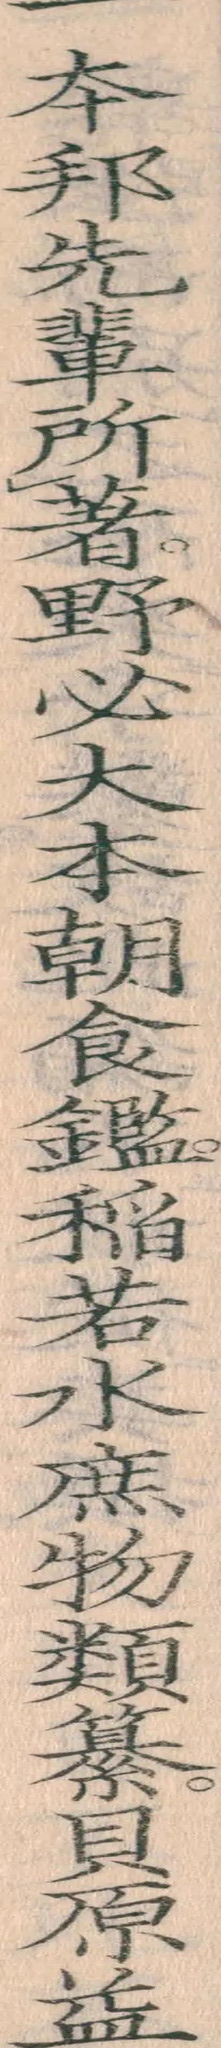一本邦先輩所著。野必大本朝食鑑。稲若水庶物類纂。貝原益
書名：皇和魚譜 2巻
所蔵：国立国会図書館 National Diet Library, JAPAN
